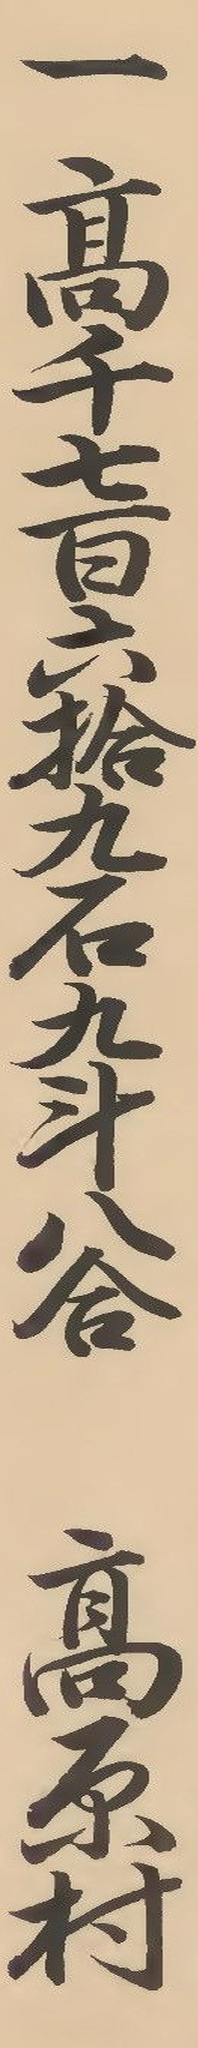一高千七百六拾九石九斗八合高原村

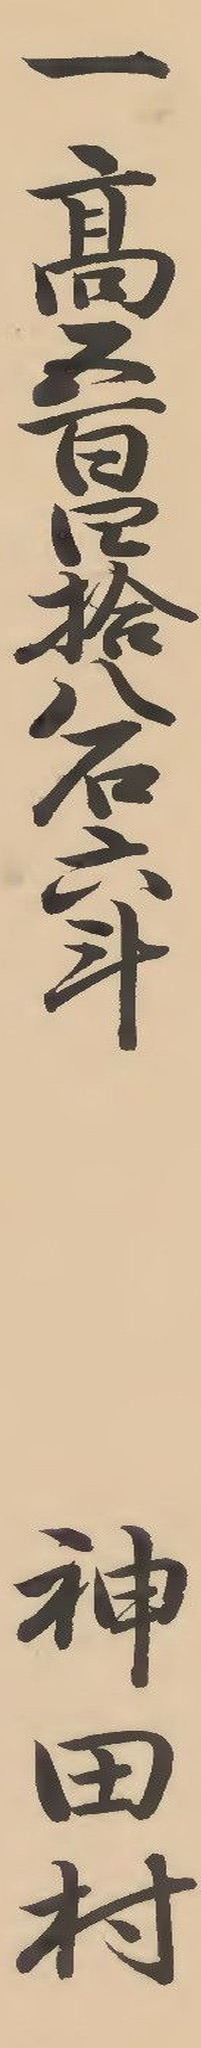一高五百四拾八石六斗神田村
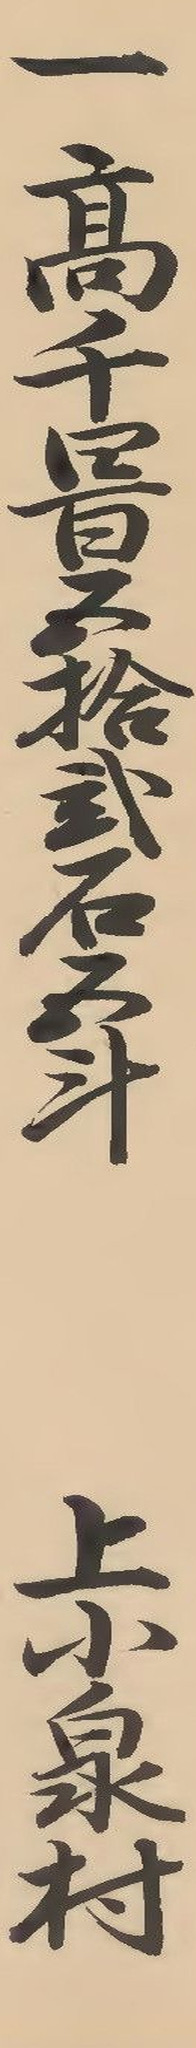一高千四百五拾弐石五斗上小泉村
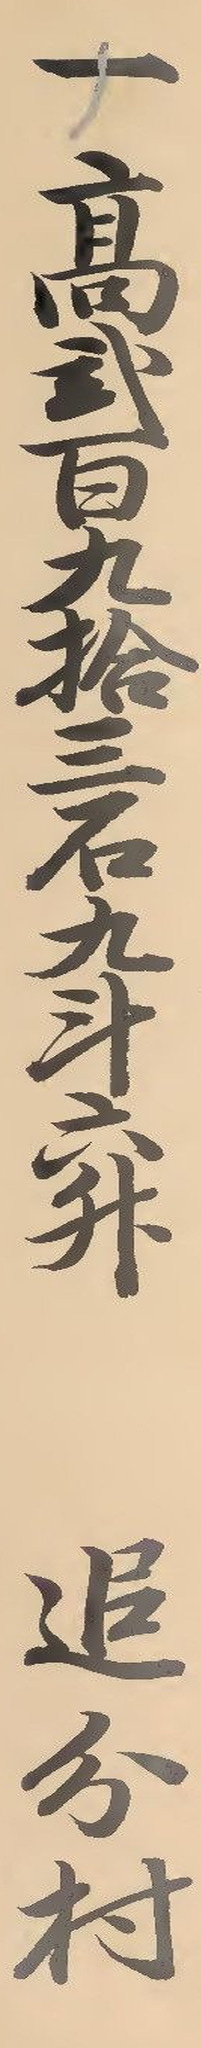一高弐百九拾三石九斗六升追分村
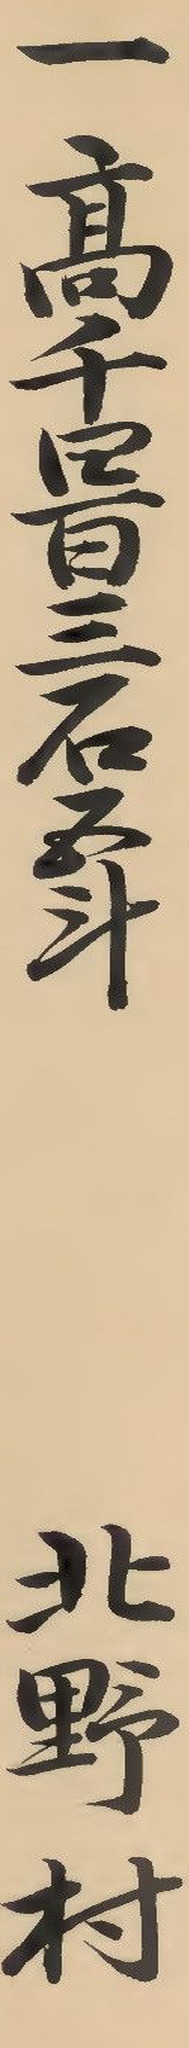一高千四百三石五斗北野村
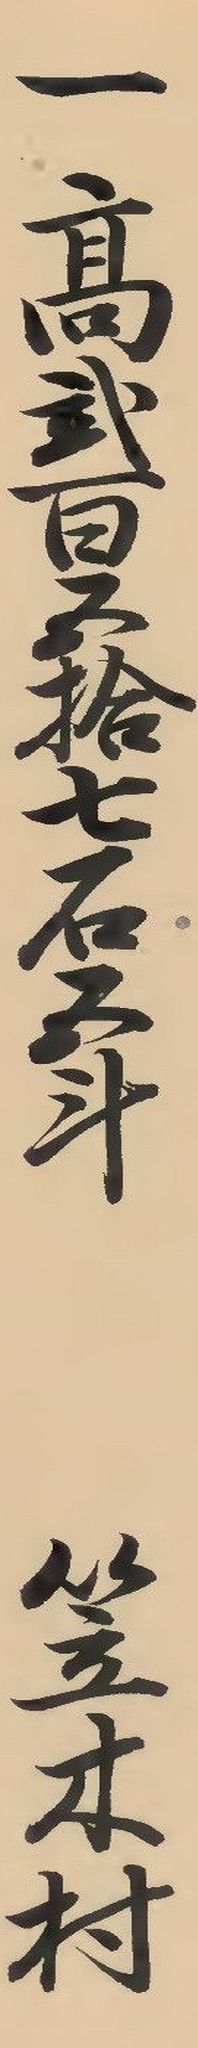一高弐百五拾七石五斗笠木村

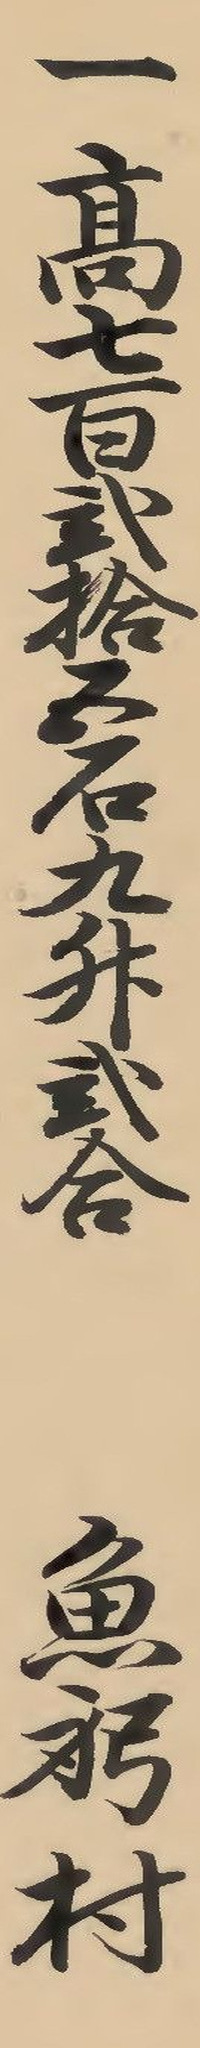一高七百弐拾五石九升弐合魚躬村
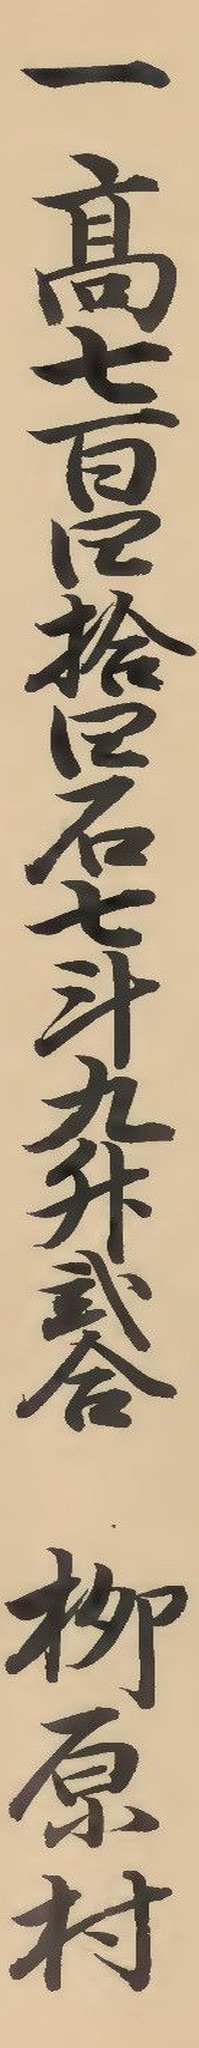一高七百四拾四石七斗九升弐合柳原村
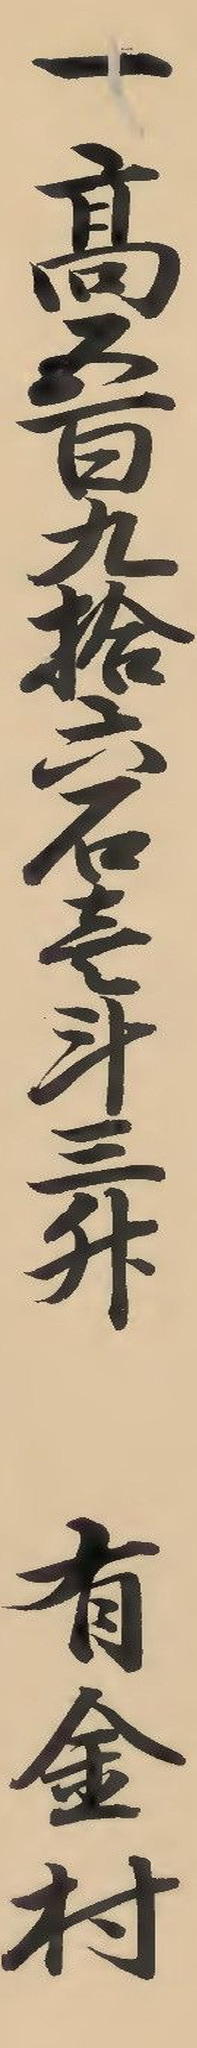一高五百九拾六石壱斗三升有金村
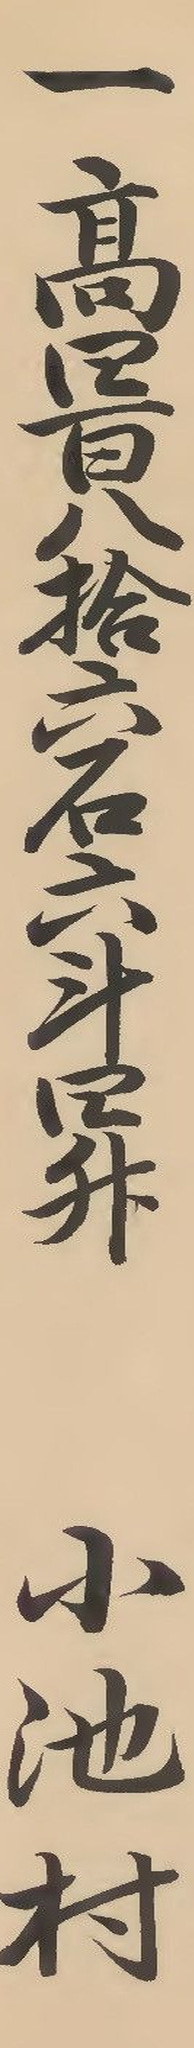一高四百八拾六石六斗四升小池村
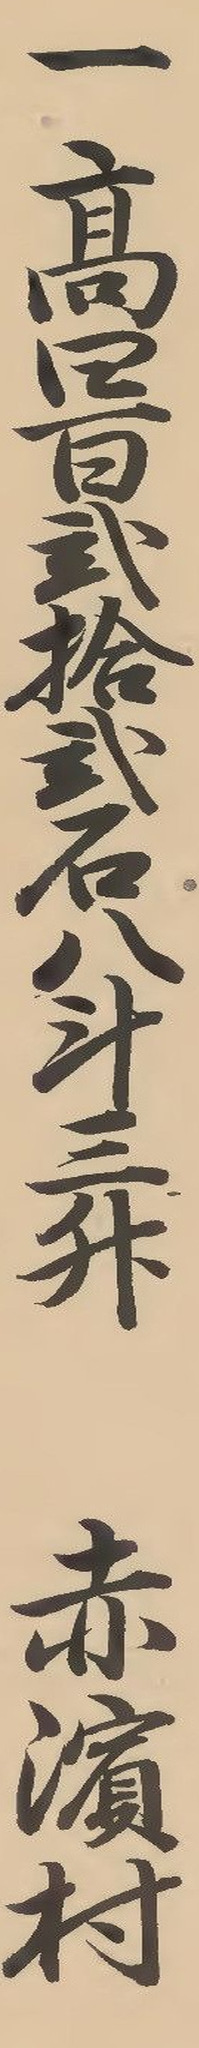一高四百弐拾弐石八斗三升赤浜村

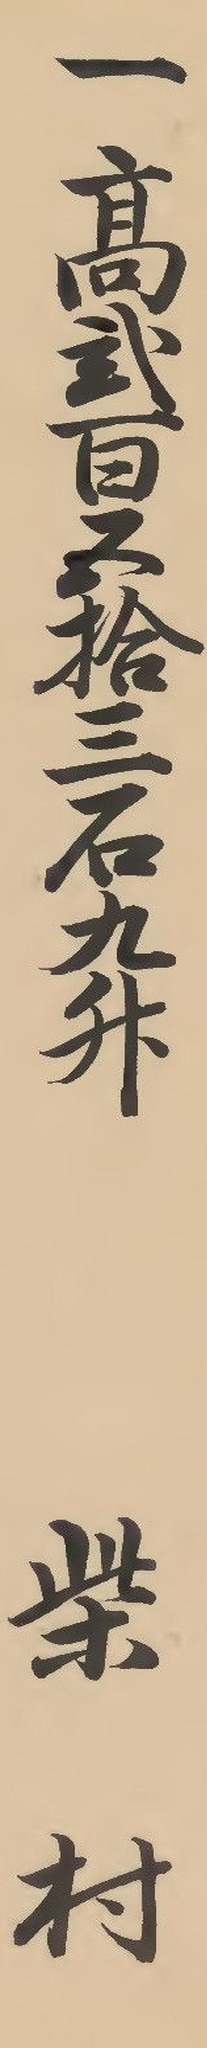一高弐百五拾三石九升柴村
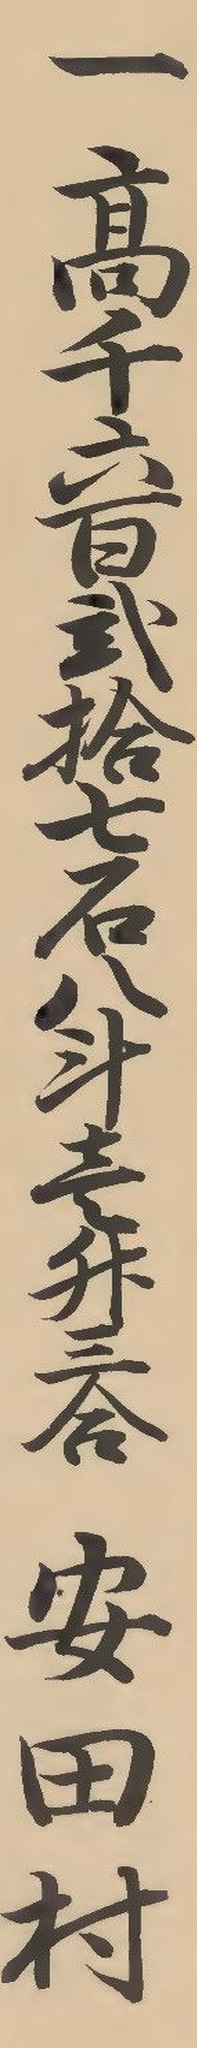一高千六百弐拾七石八斗壱升三合安田村
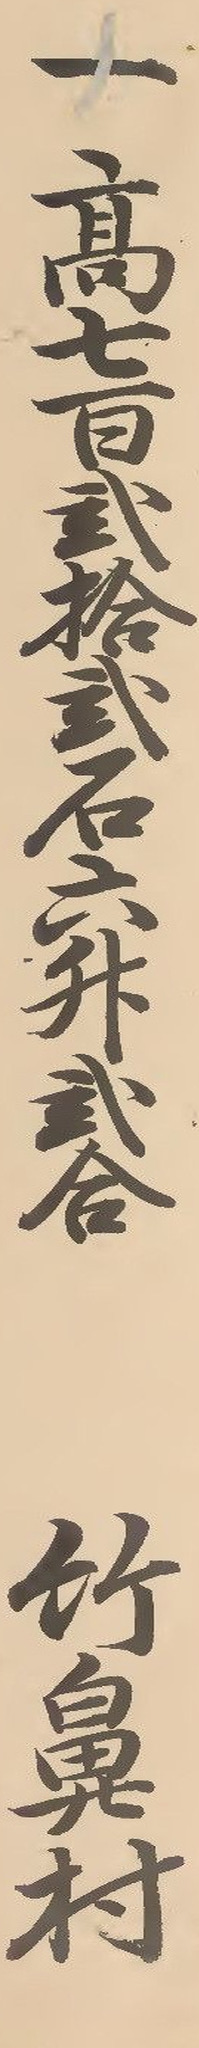一高七百弐拾弐石六升弐合竹鼻村
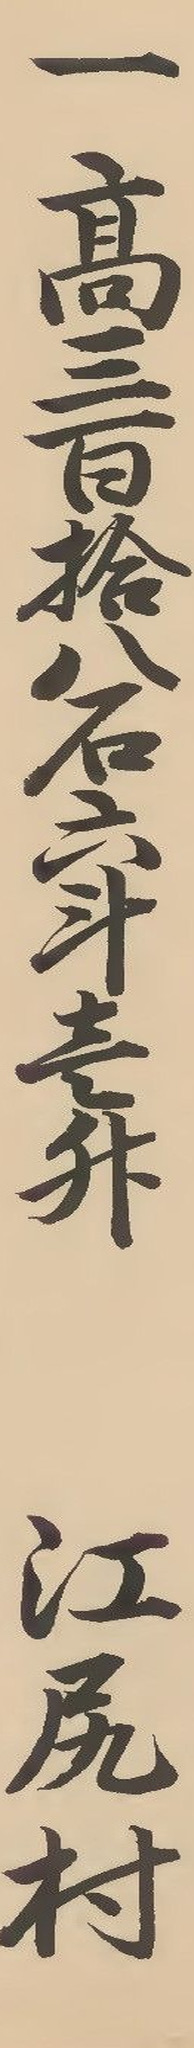一高三百拾八石六斗壱升江尻村

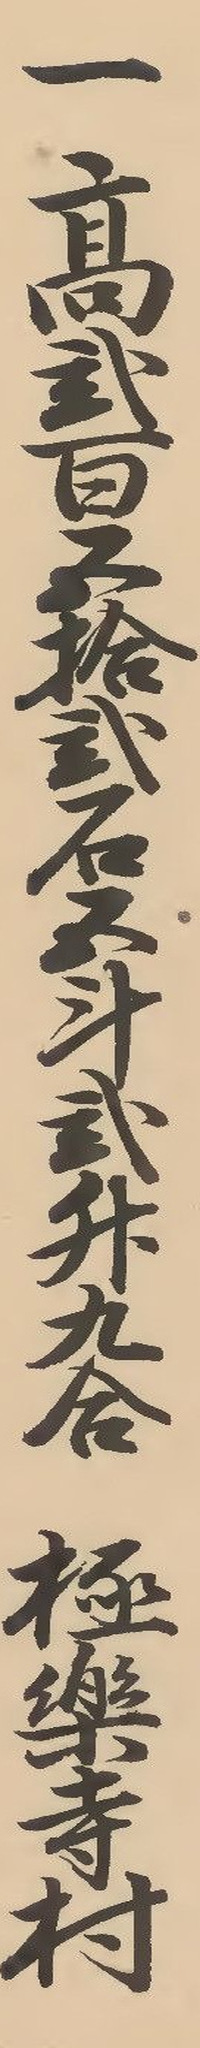一高弐百五拾弐石五斗弐升九合極楽寺村
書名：越中国郷帳
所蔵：国立公文書館 National Archives of Japan
